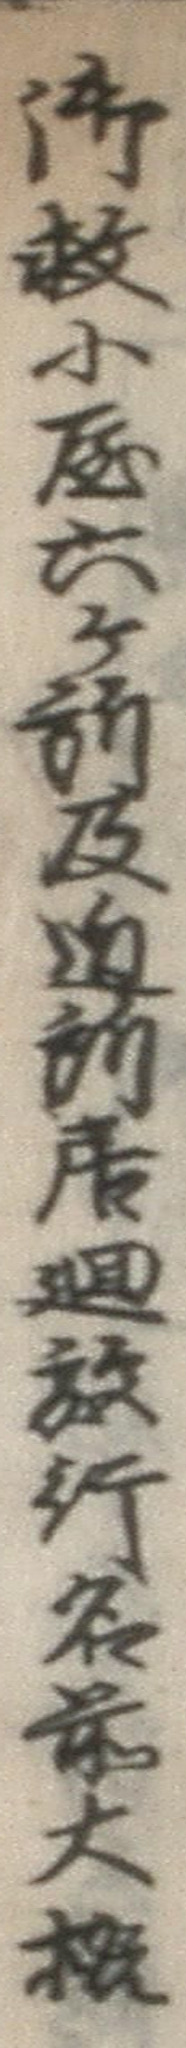御救小屋六ケ所及近所居廻施行名前大概
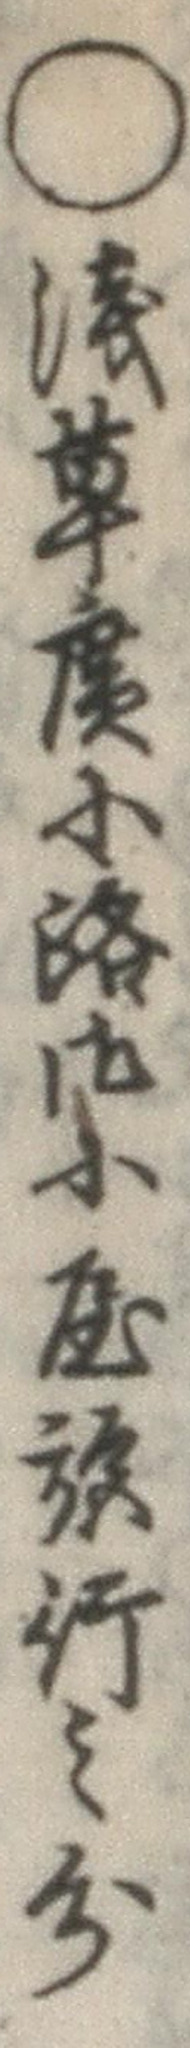○浅草廣小路御小屋施行之分
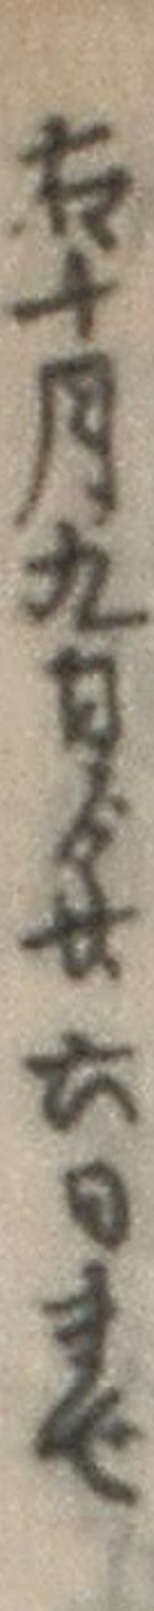右十月九日ゟ廿六日まで
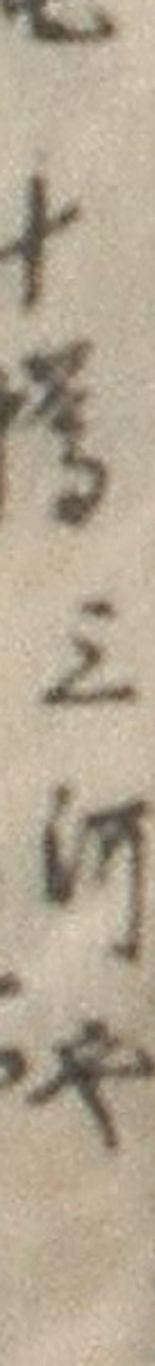萬屋三河や
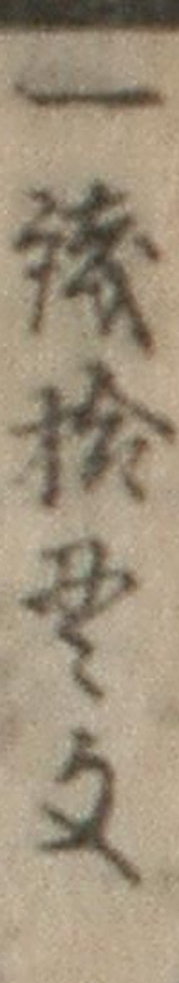一銭百貫文
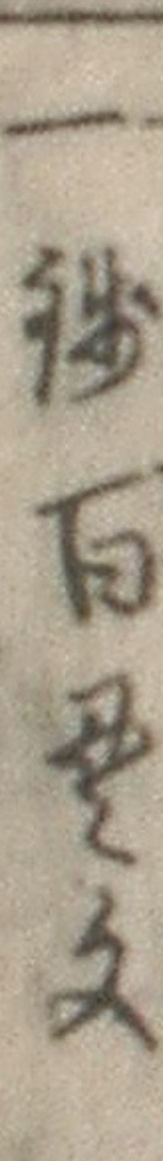一銭百貫文
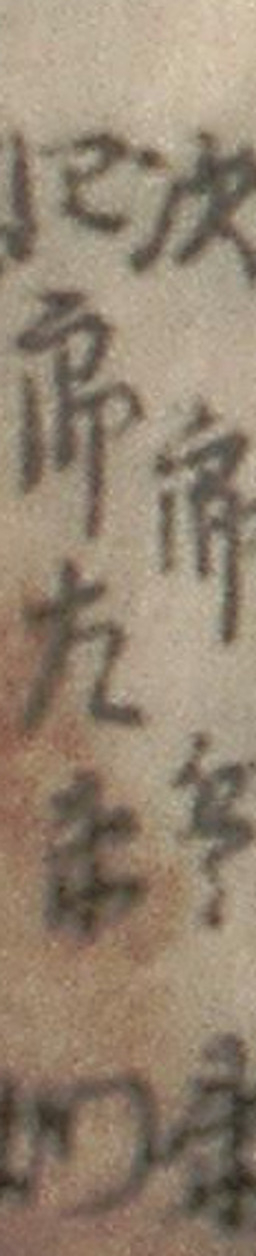四郎左衛門

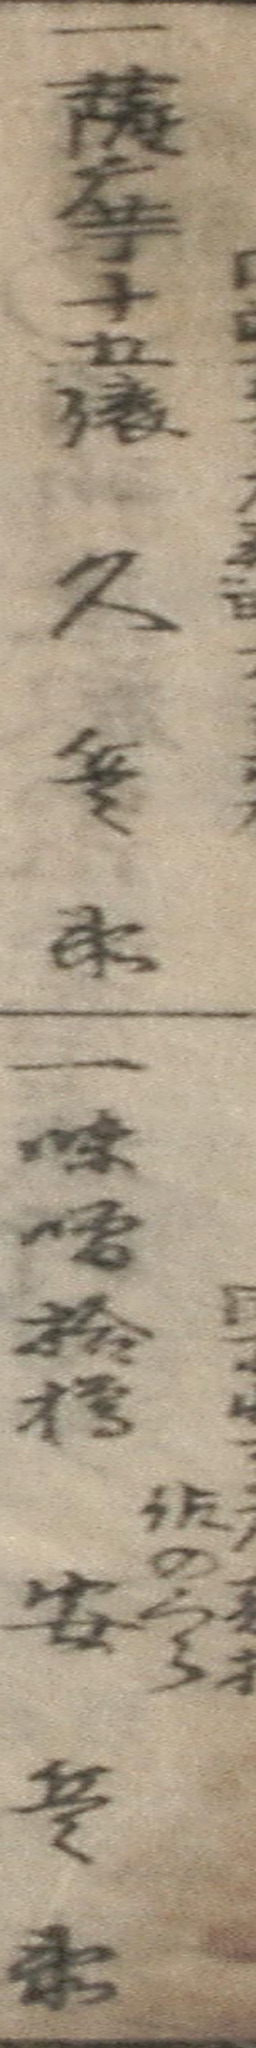一味噌拾樽安兵衛
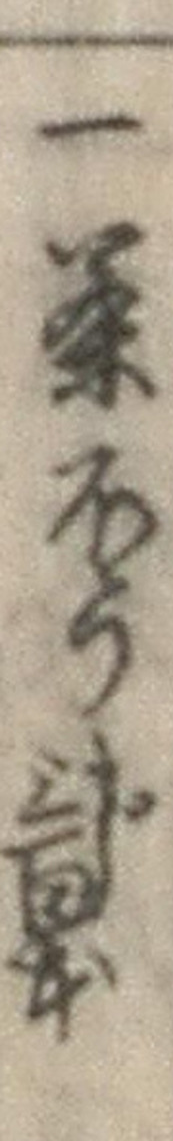一茶ほうじ三百本
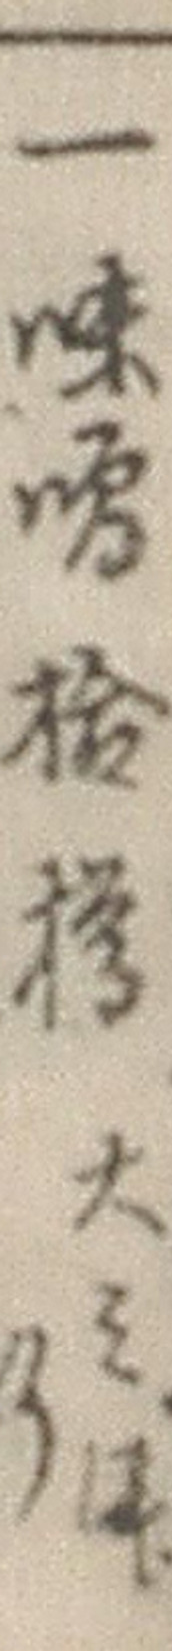一味噌拾樽安兵衛
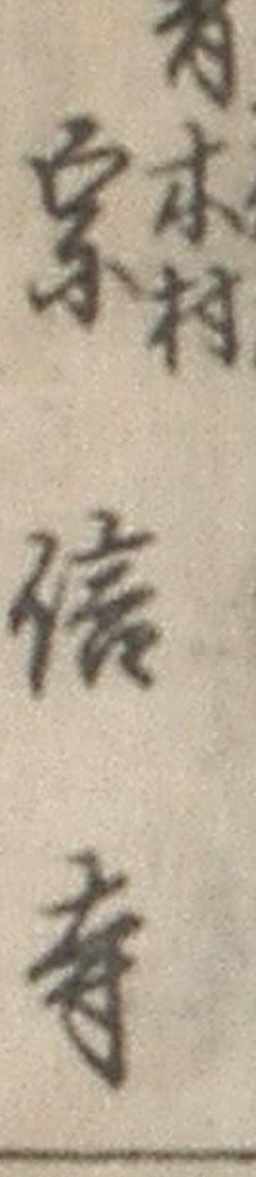宗信寺
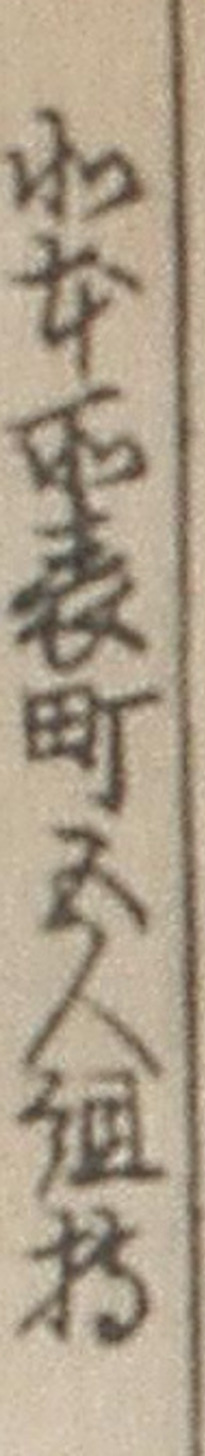北本所表町五人組持
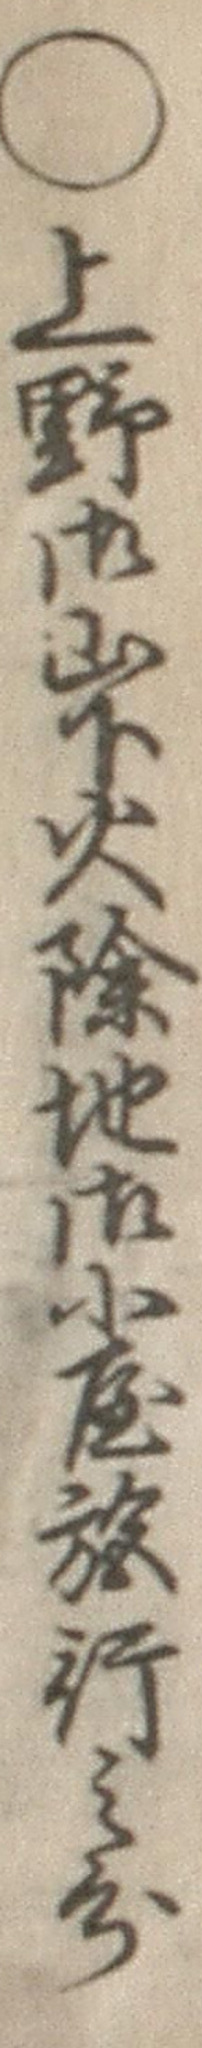○上野御山下火除地御小屋施行之分
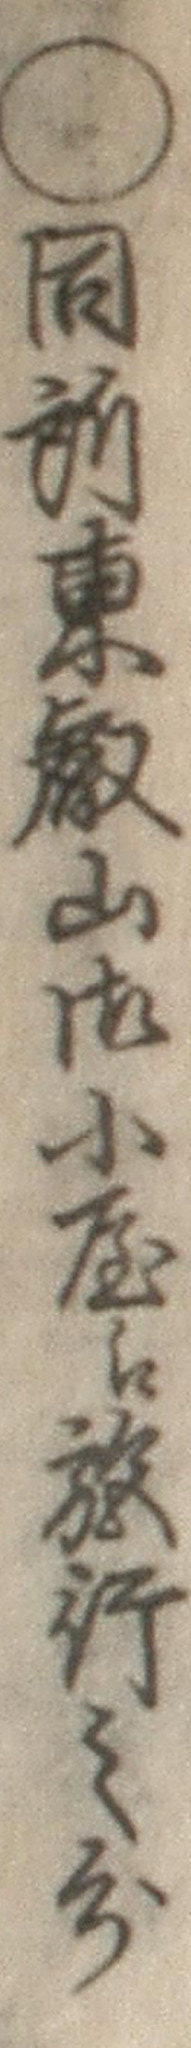○同所東叡山御小屋施行之分

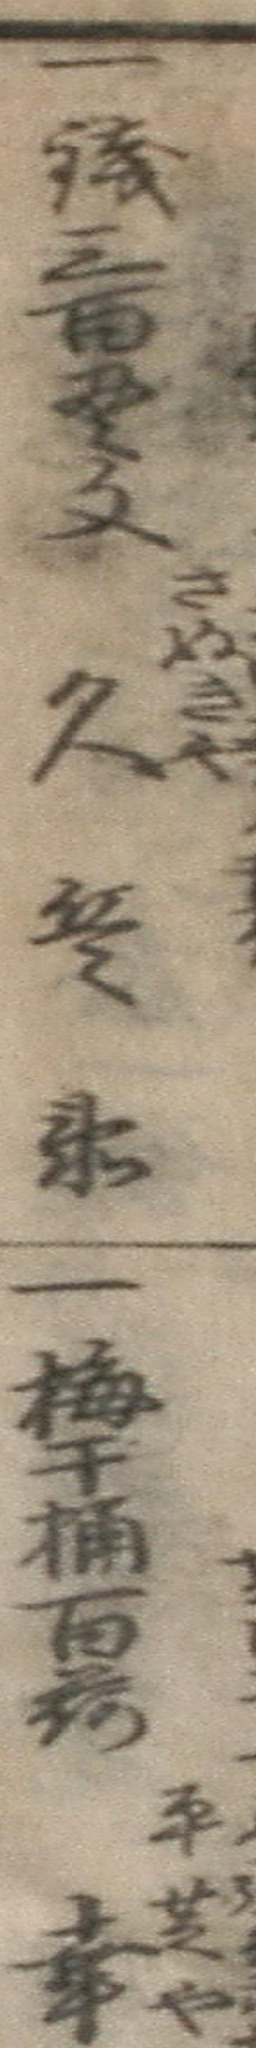一銭三百貫文久兵衛一梅干桶百荷幸七
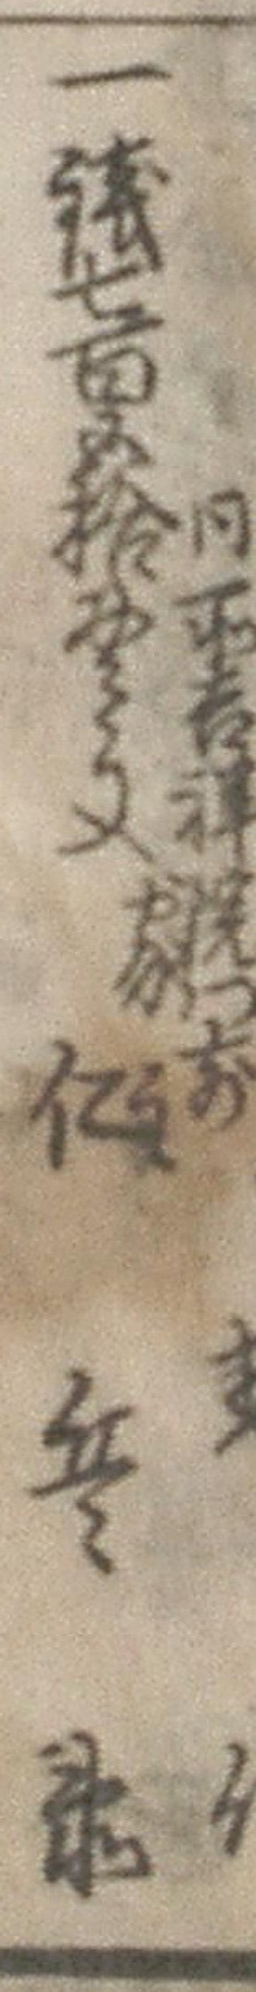一銭七百五拾貫文仁兵衛
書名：江戸大地震末代鑑
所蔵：東京大学地震研究所図書室 Earthquake Research Institute Library, The University of Tokyo, JAPAN
